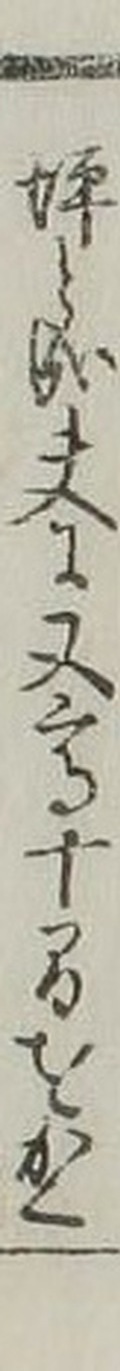百◆坪と成夫に又高十間をかく
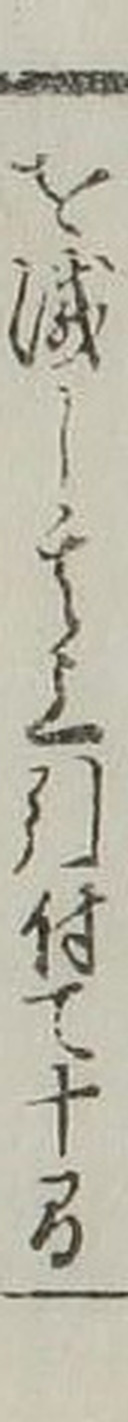を減し其上引付て十間
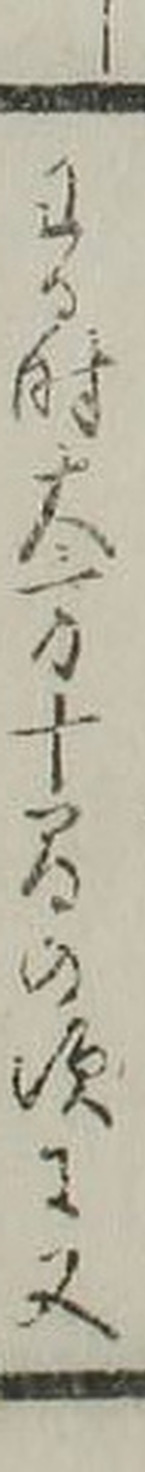わる時大方十間の次に又
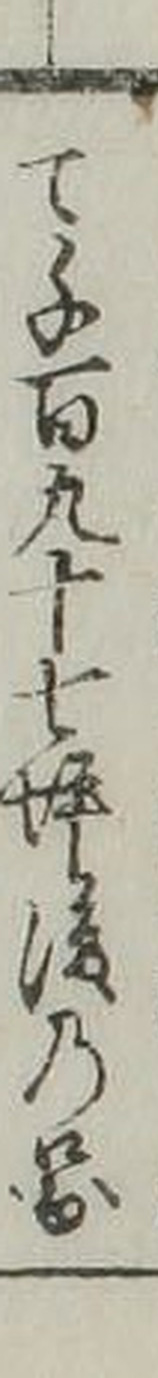て千百九十七坪後の図
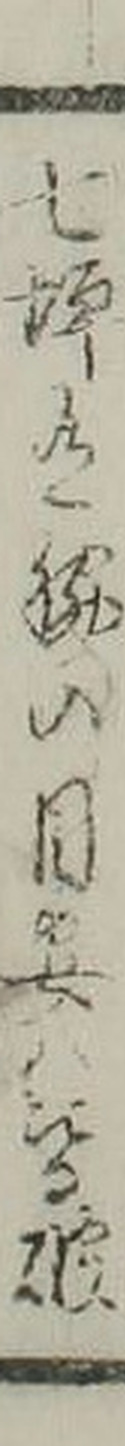脇百◆七坪有脇の目安は皆破

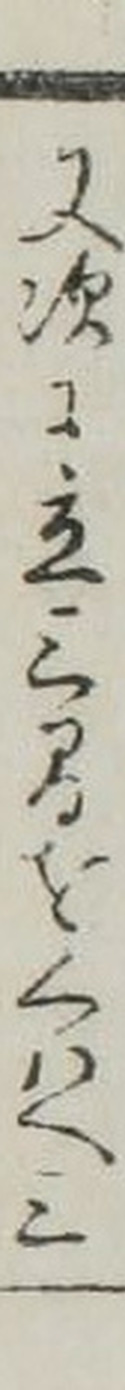又次に立三間をくはへ三
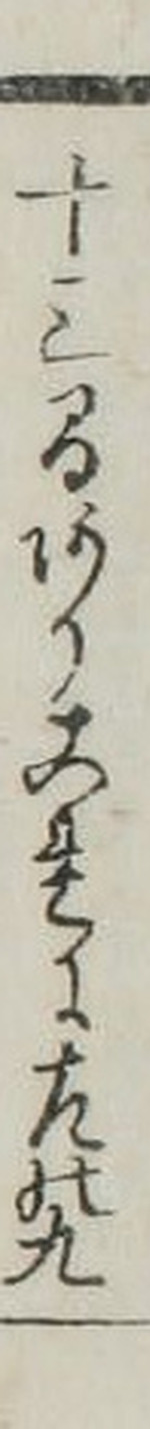坪十三間ありこれに左の九
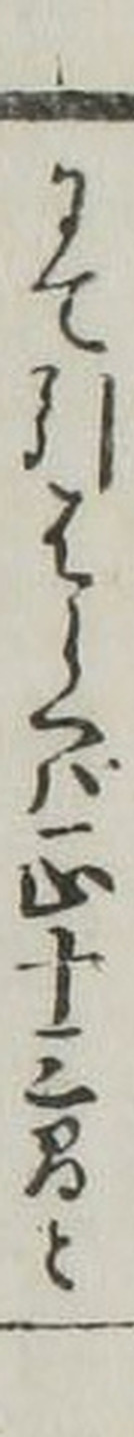十にて引はらへば正十三間と
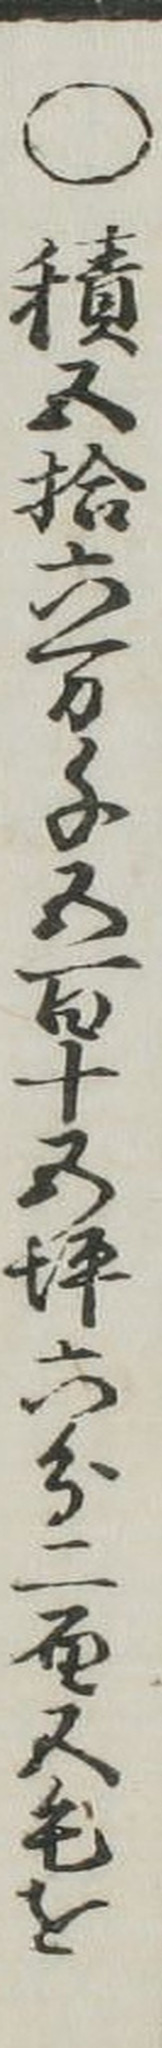○積五拾六万千五百十五坪六分二厘五毛を
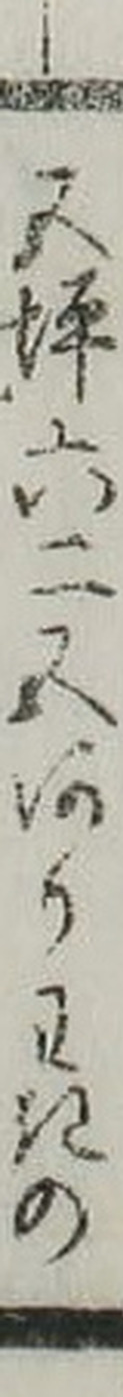五坪六二五ありわきの
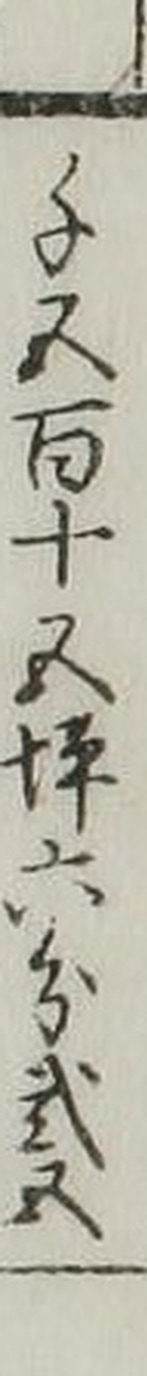千五百十五坪六分弐五
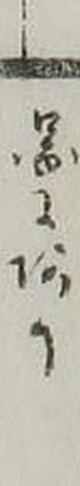図にあり
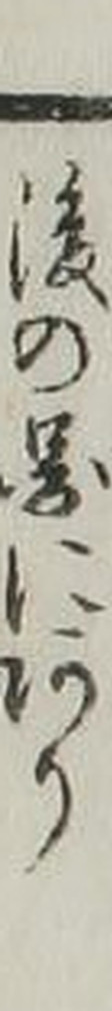後の図にあり

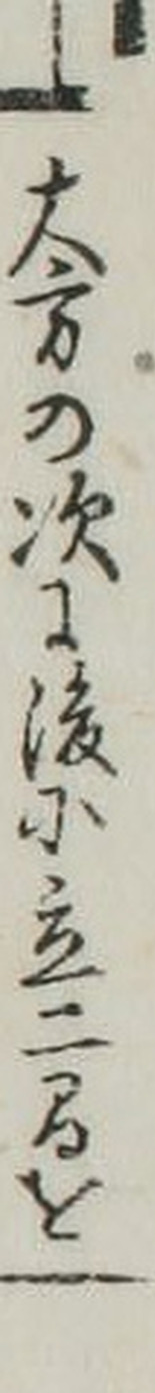◆毛大方の次に後に立二間を
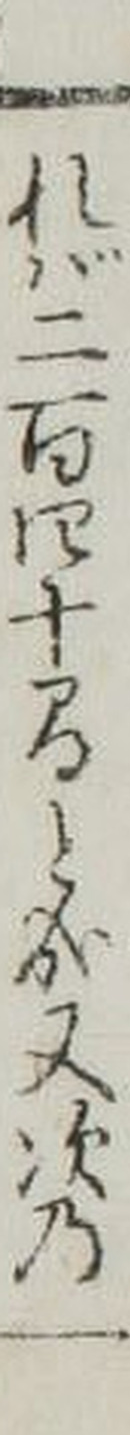十◆れば二百四十間と成又次の
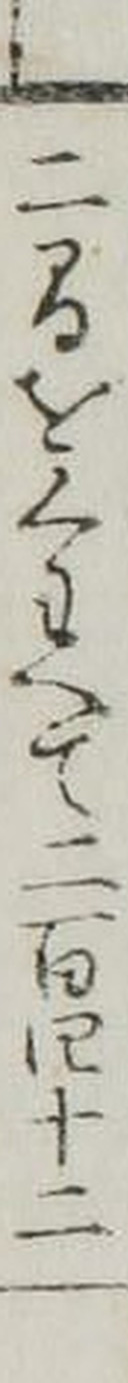百◆二間をくわへて二百四十二
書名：宝玉塵劫記
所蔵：東京学芸大学教育コンテンツアーカイブ
